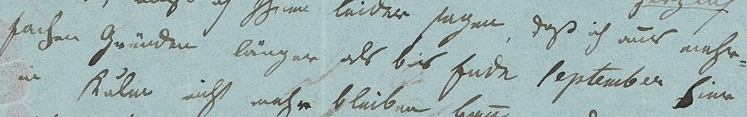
fachen Gründen länger als bis Ende September hier
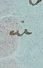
in
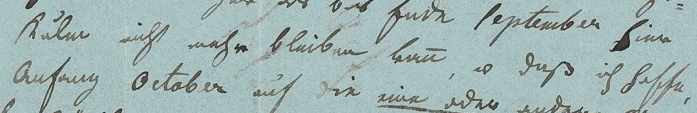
Kulm nicht mehr bleiben kann, & daß ich hoffe,
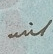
mit
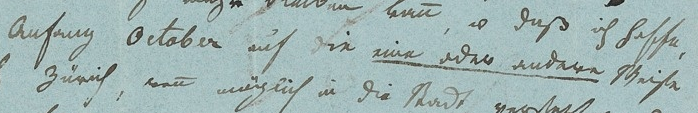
Anfang October auf die eine oder andere Weise
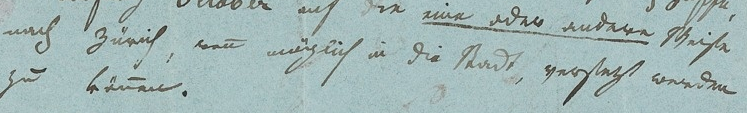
nach Zürich, wenn möglich in die Stadt, versezt werden
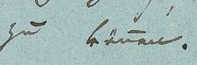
zu können.
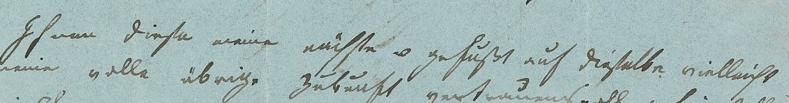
Ihnen diese meine nächste & gefußt auf dieselbe vielleicht
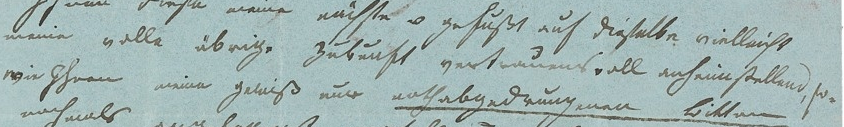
meine volle übrige Zukunft vertrauensvoll anheimstellend, so-
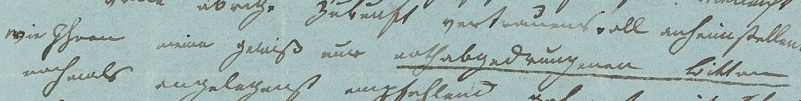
wie Ihnen meine gewiß nur nothgedrungenenBitten
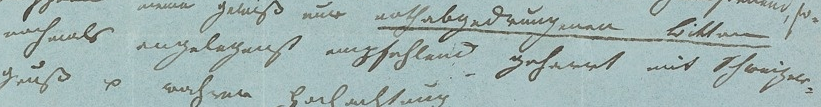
nochmals angelegenst empfehlend geharrt mit Schweizer-
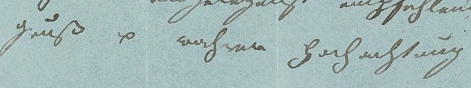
gruß & wahrer Hochachtung
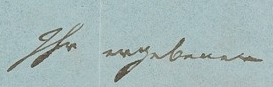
Ihr ergebener
